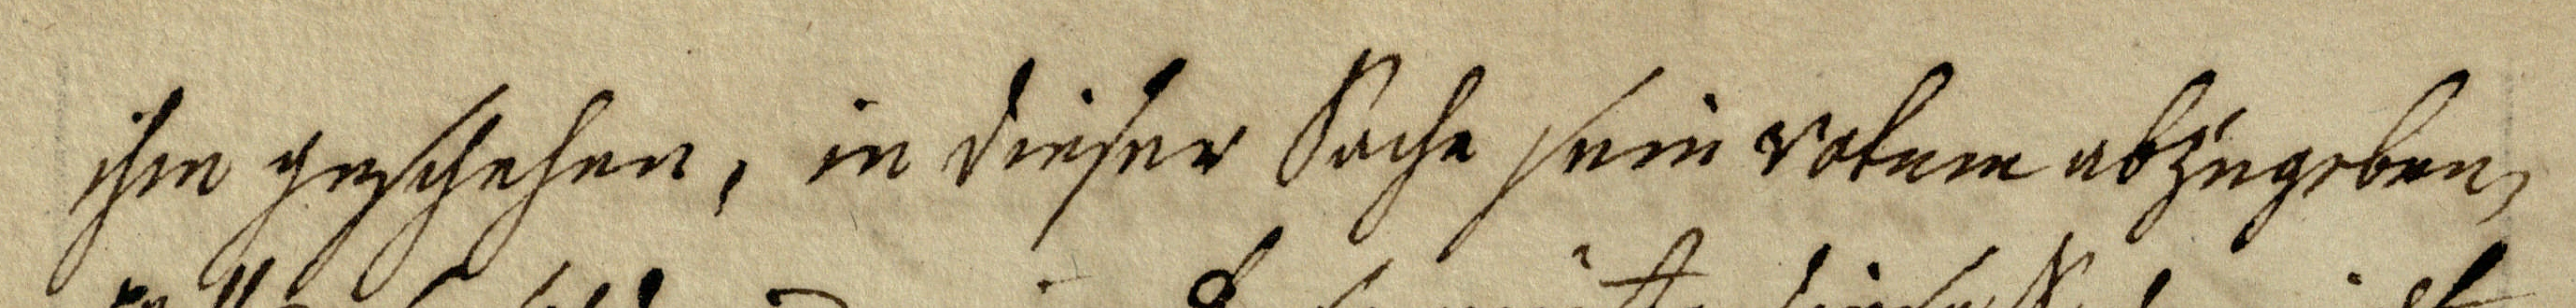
ihm geschehen, in dieser Sache sein votum abzugeben,
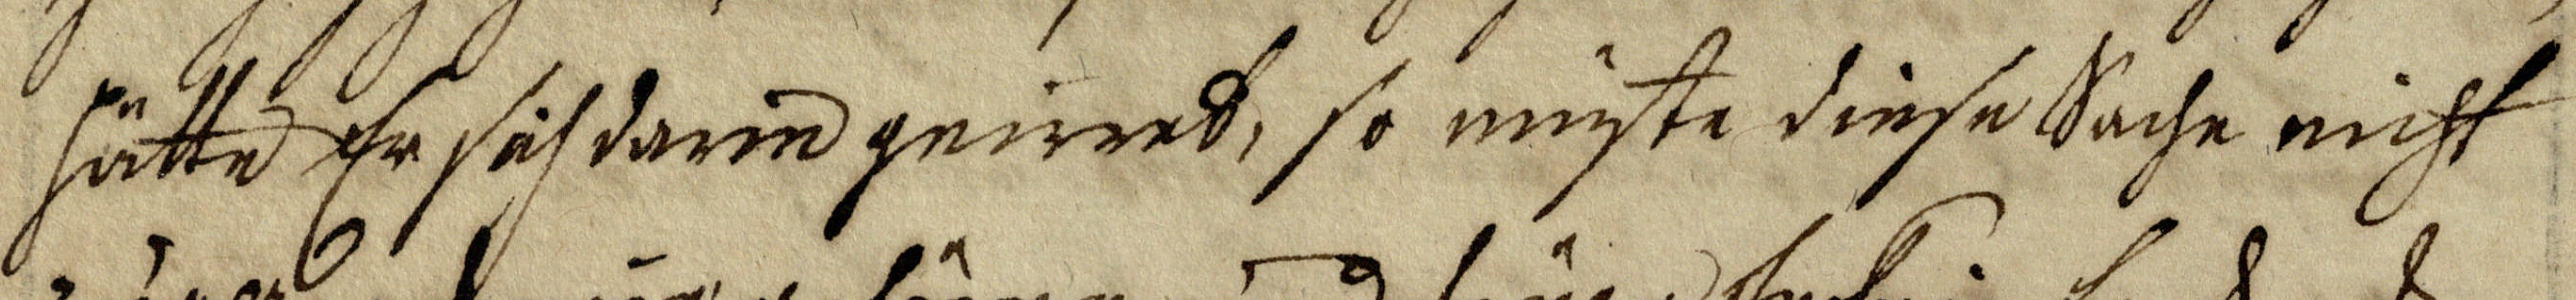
hätte Er sich darin geirret, so müßte diese Sache nicht
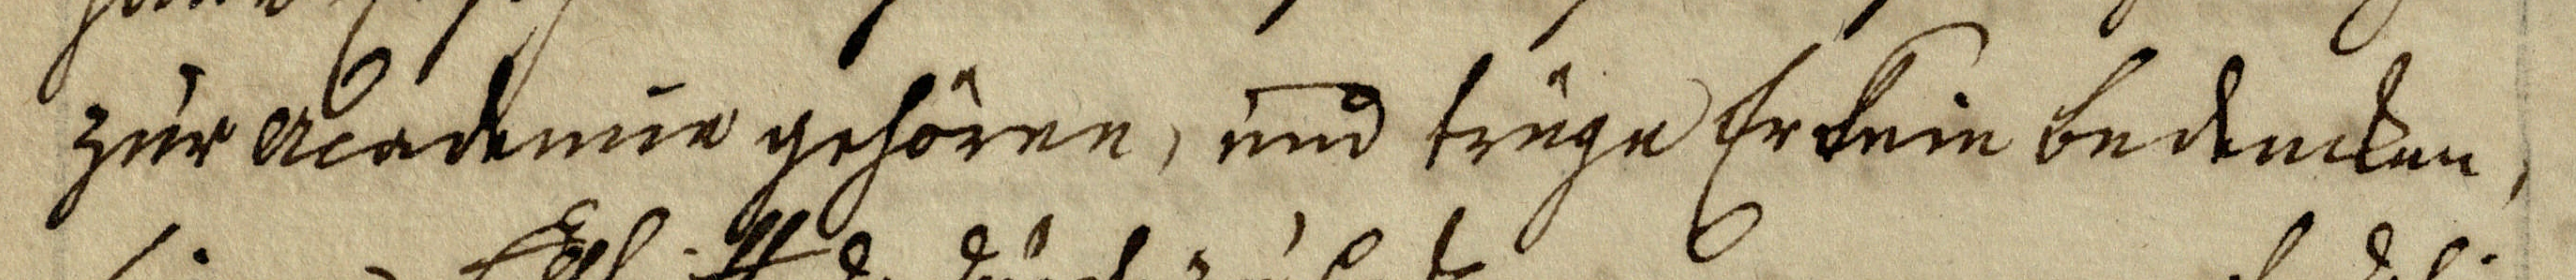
zur Academie gehören, und trüge Er kein Bedenken,
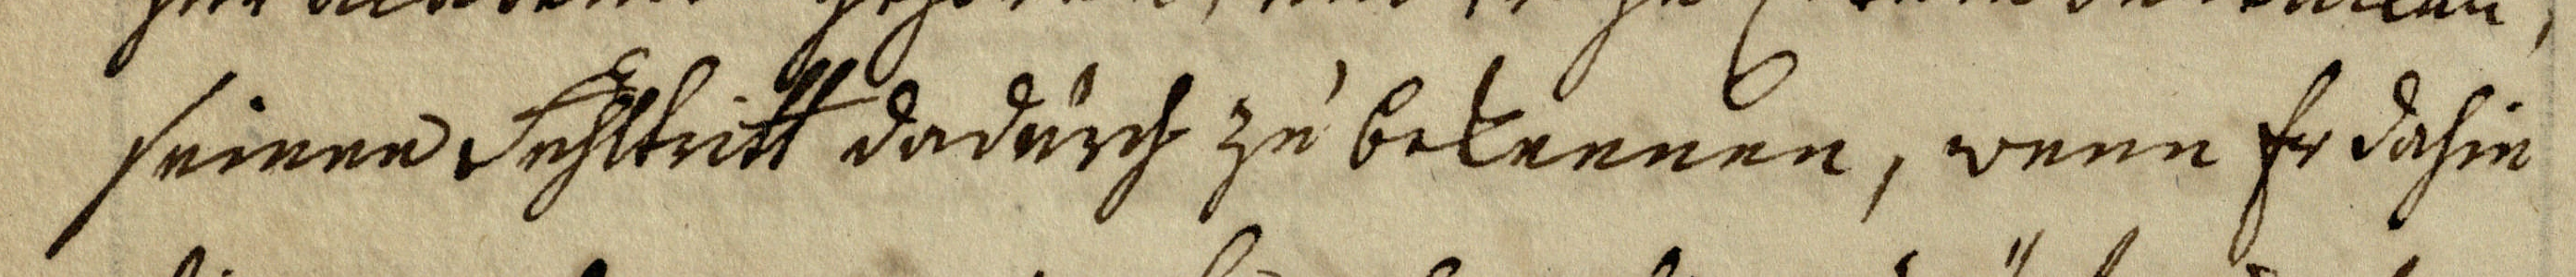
seinen Fehltritt dadurch zu bekennen, wenn Er dahin
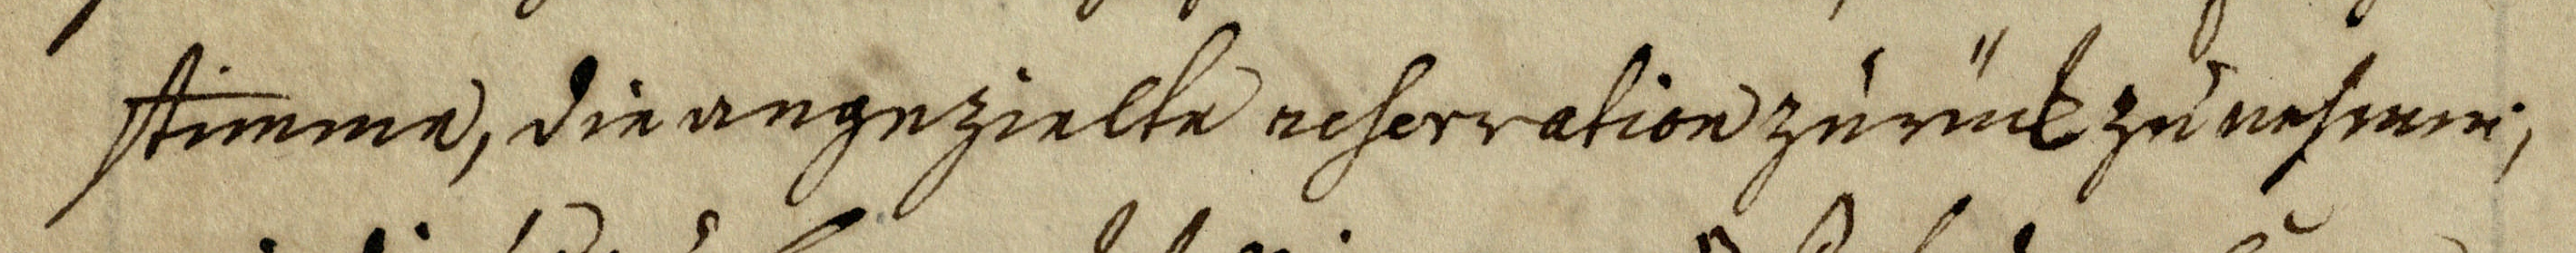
stimme, die angezielte reservation zurück zu nehmen,
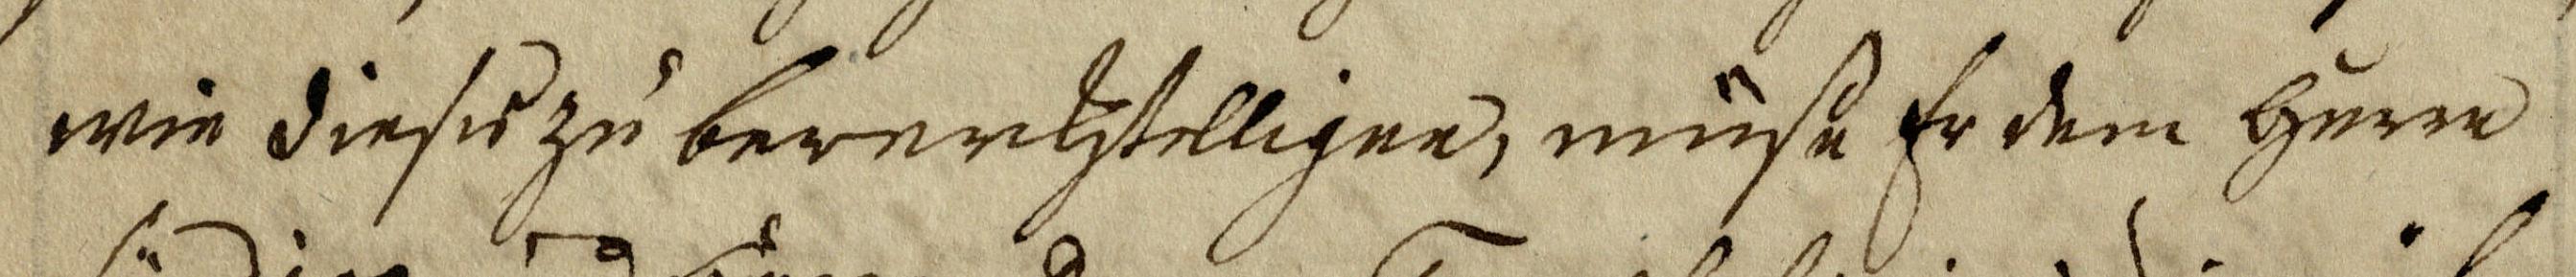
wie dieses zu bewerksteligen, müße Er dem Herrn
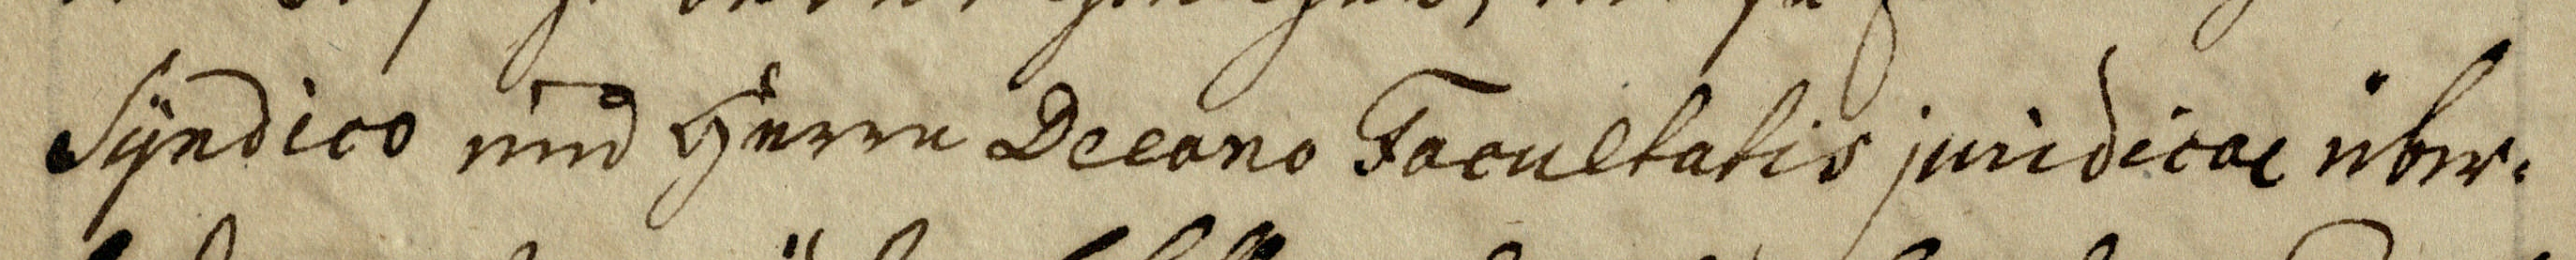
Sÿndico und Herrn Decano Facultatis juridicae über¬
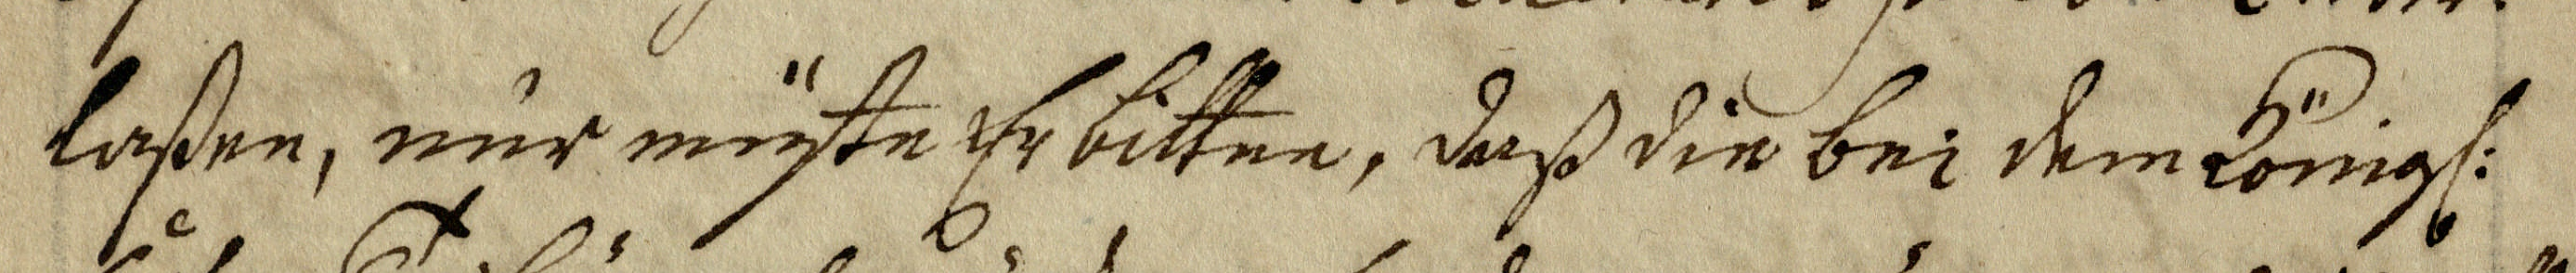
laßen, nur müßte Er bitten, daß die bei dem Königl.
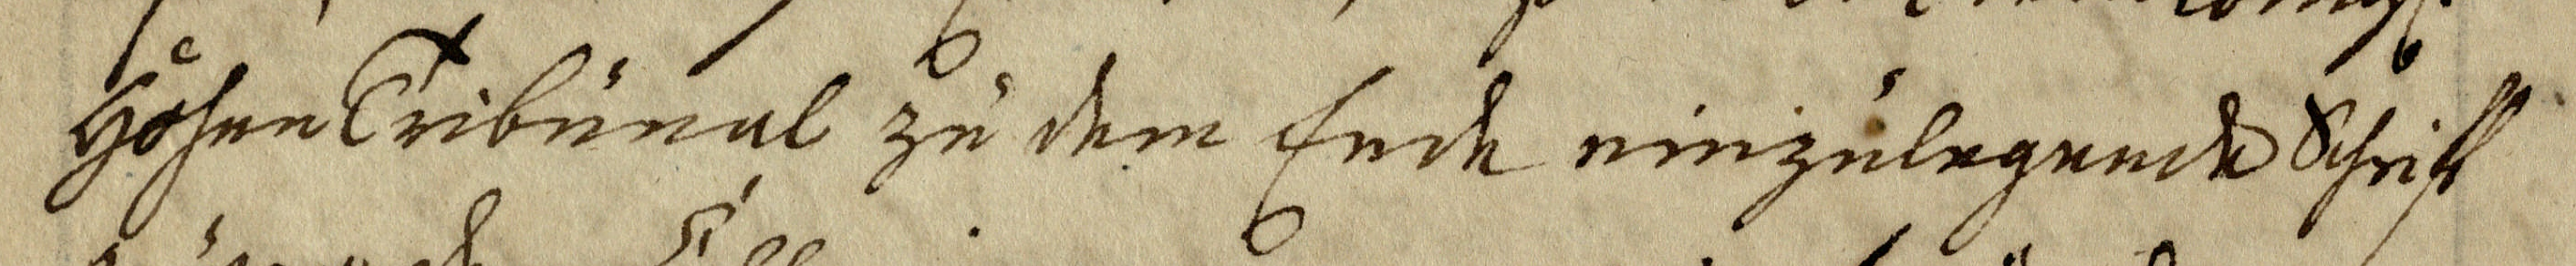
Hohen Tribunal zu dem Ende einzulegende Schrift
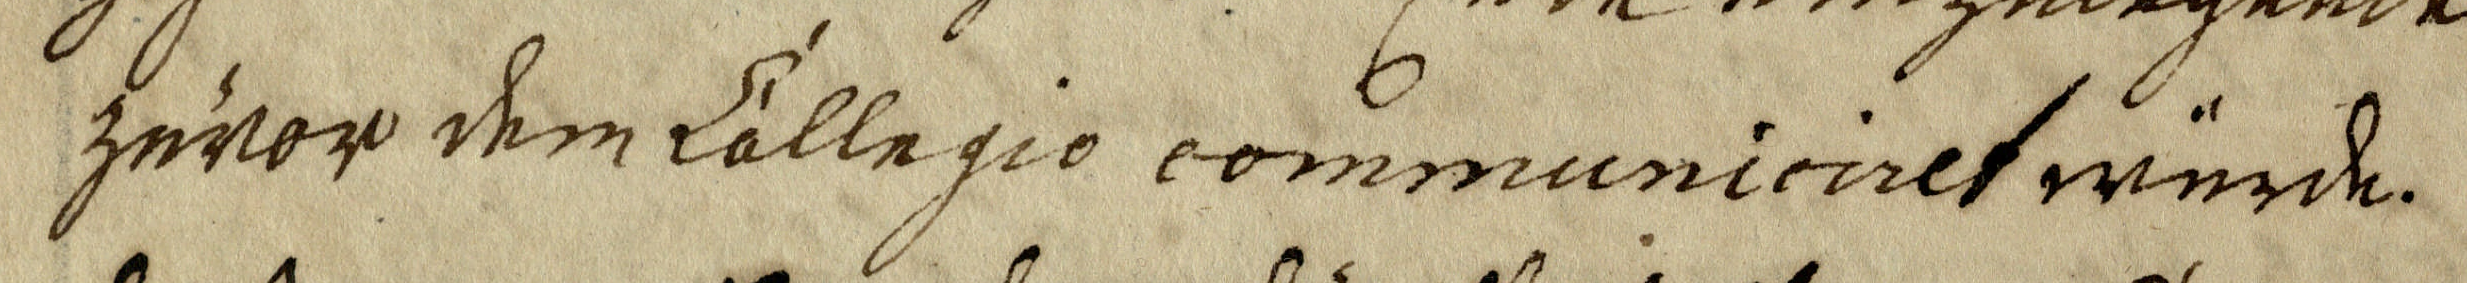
zuvor dem Collegio communiciret würde.
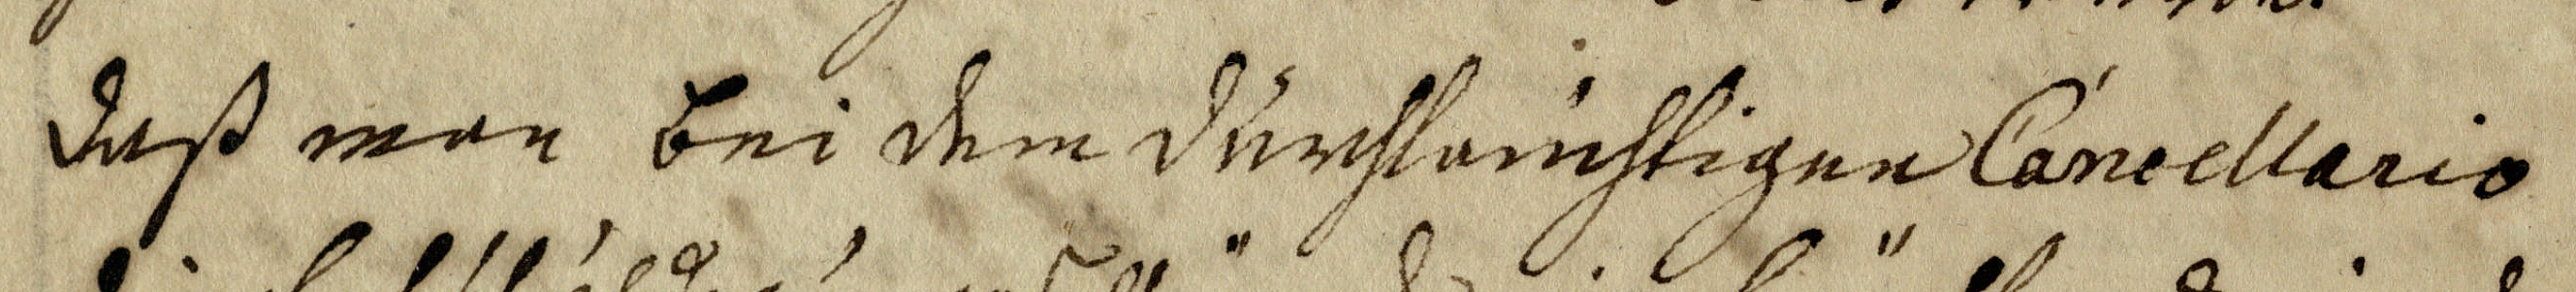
Daß man bei dem durchlauchtigen Cancellario
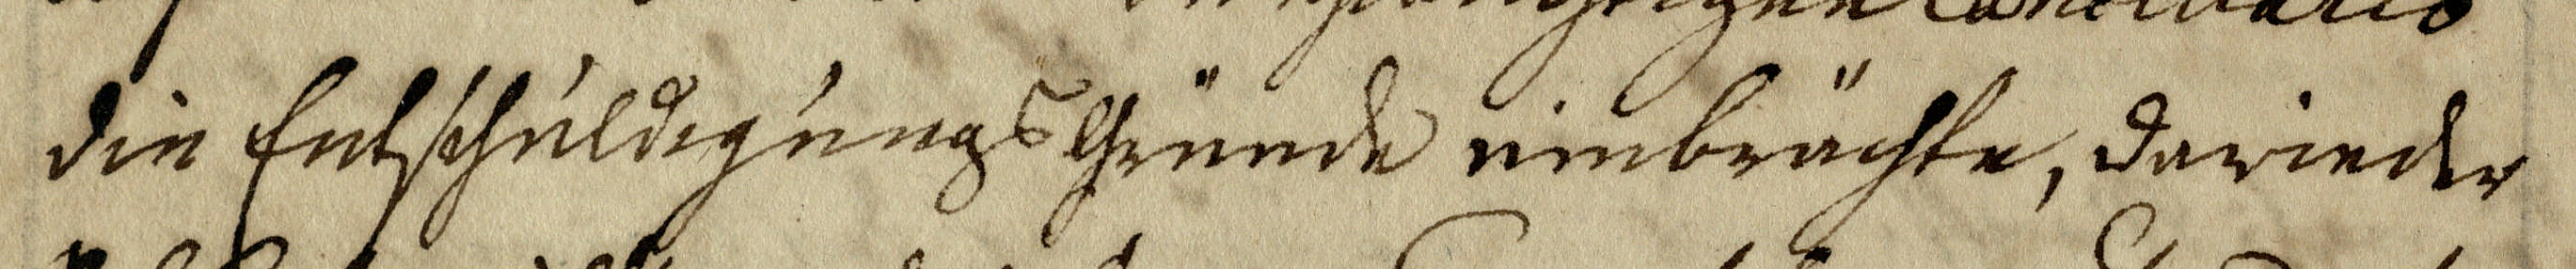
die Entschuldigungs Gründe einbrächte, dawieder
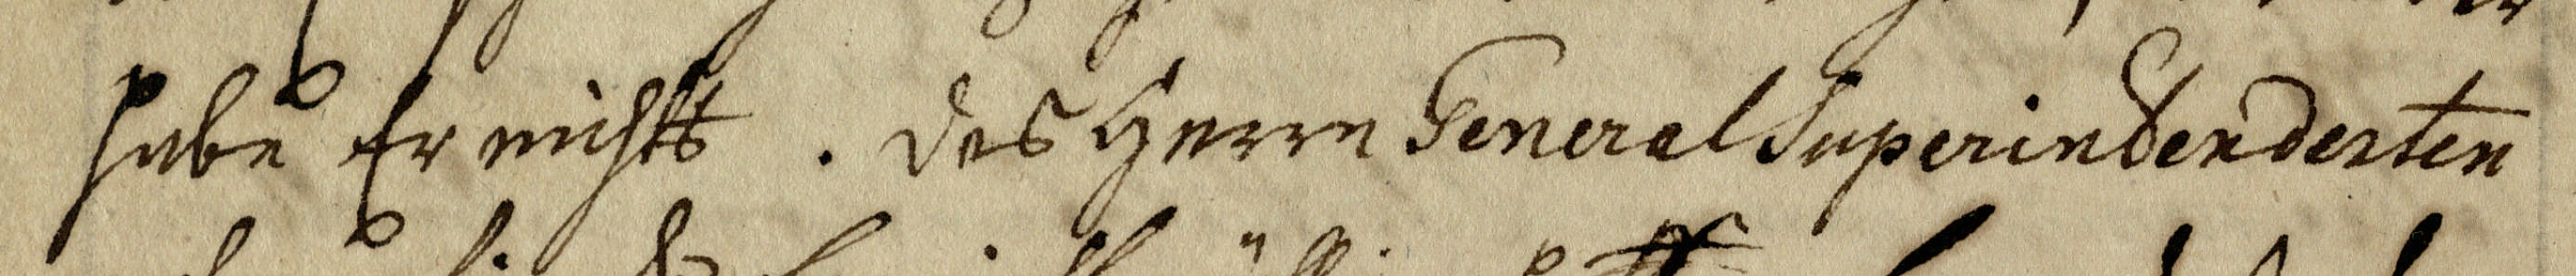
habe Er nichts. Des Herrn GeneralSuperintendenten
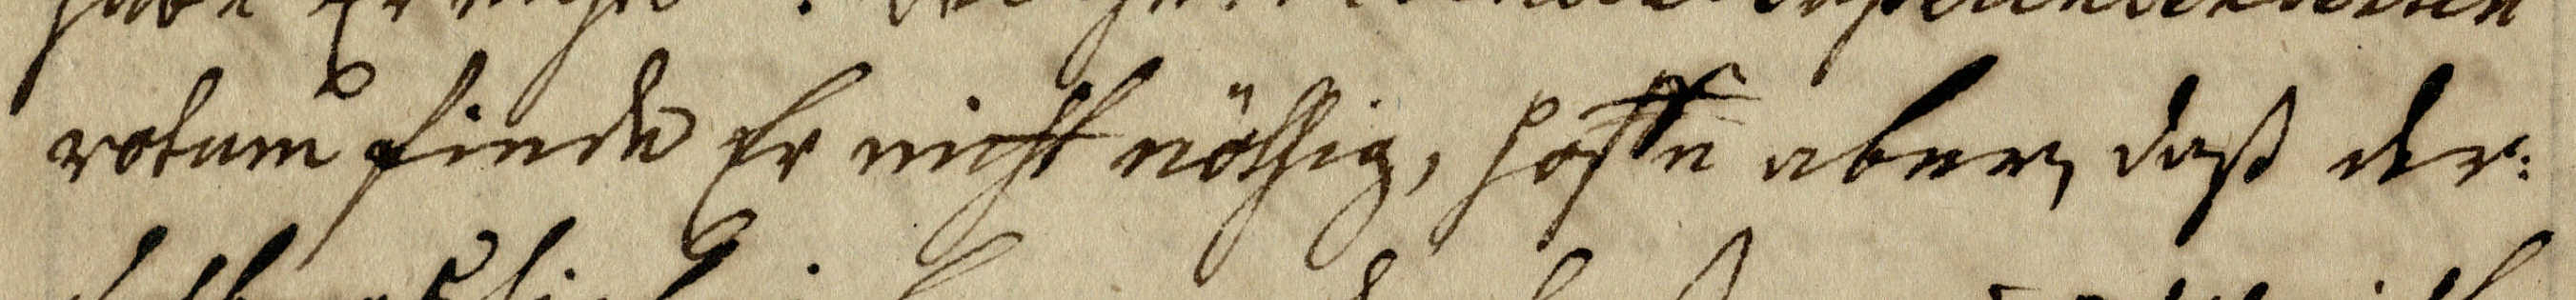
votum finde Er nicht nöthig, hoffe aber, daß der¬
